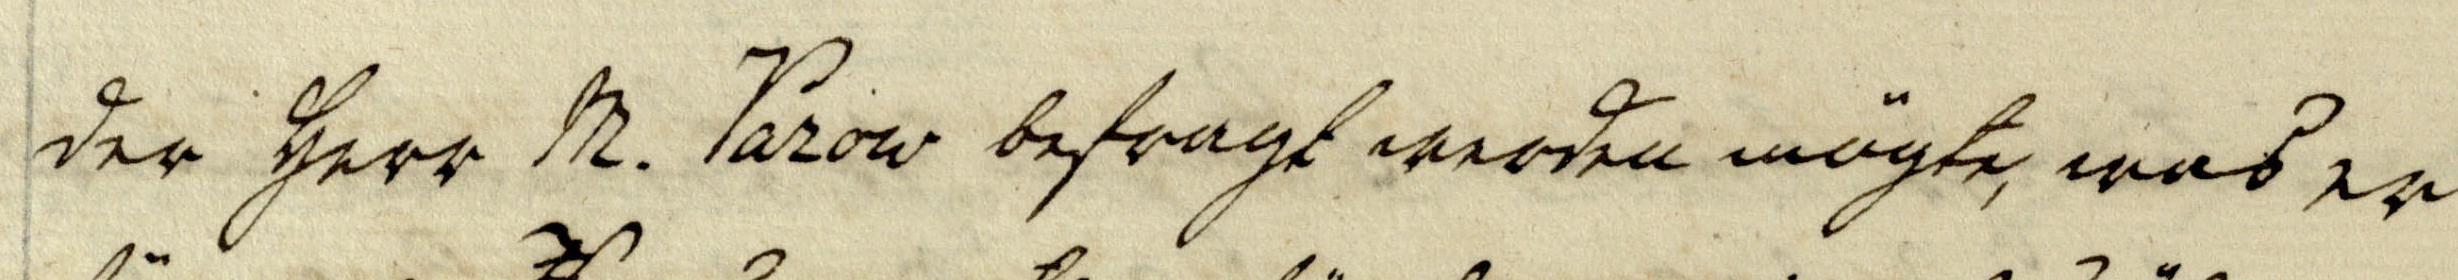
der Herr M. Parow befragt werden mögte, was er
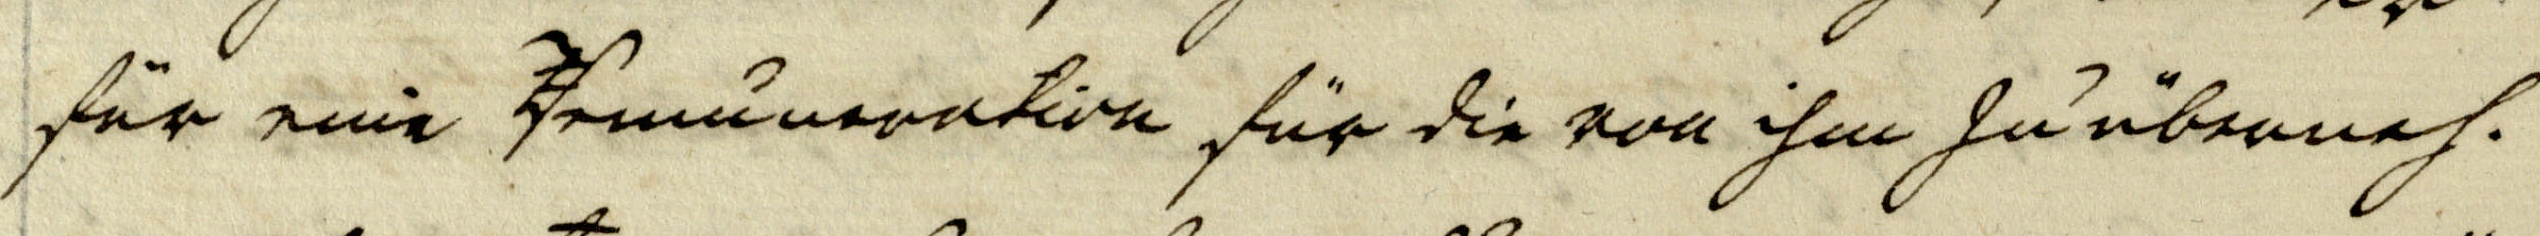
für eine Remuneration für die von ihm zu überneh¬
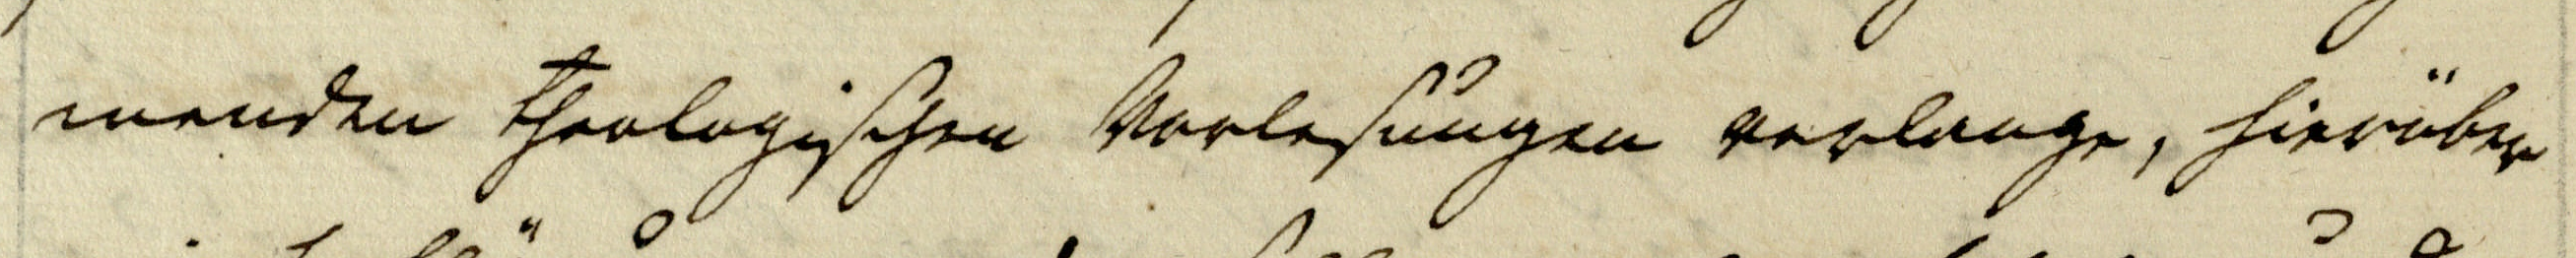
menden theologischen Vorlesungen verlange, hierüber
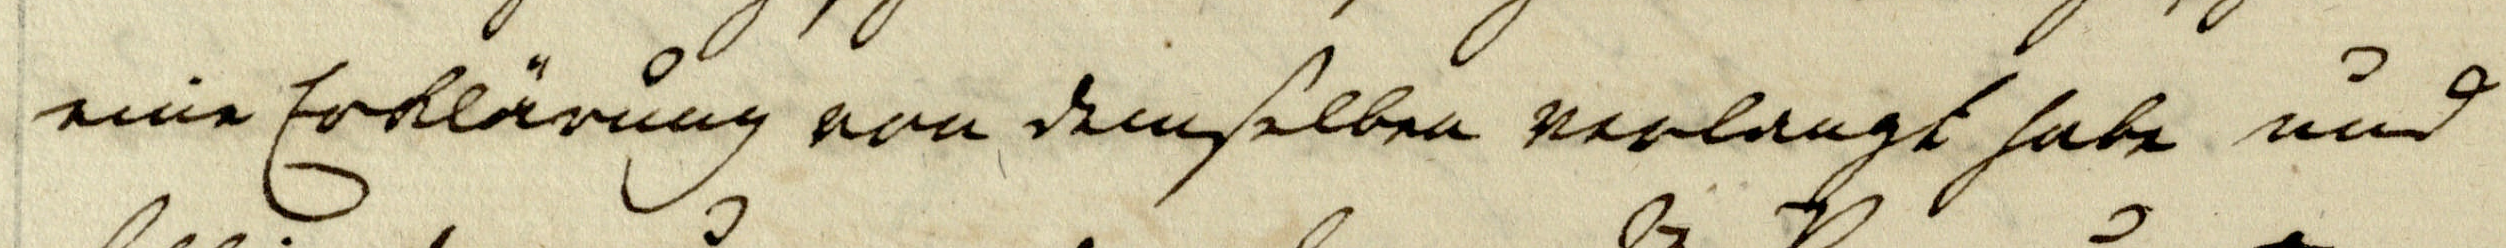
eine Erklärung von demselben verlangt habe und
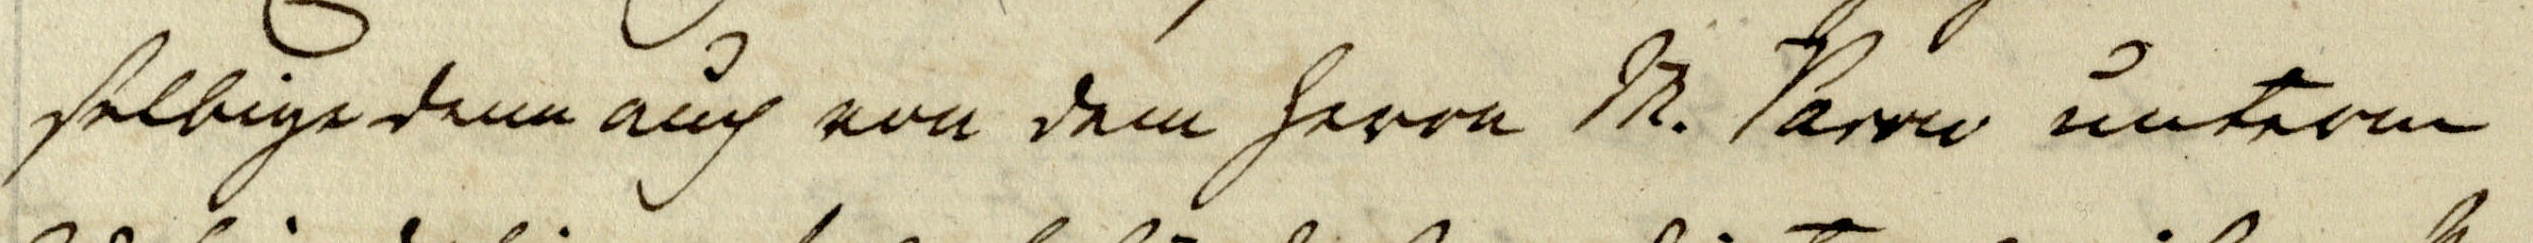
selbige den auch von dem Herrn M. Parow unterm
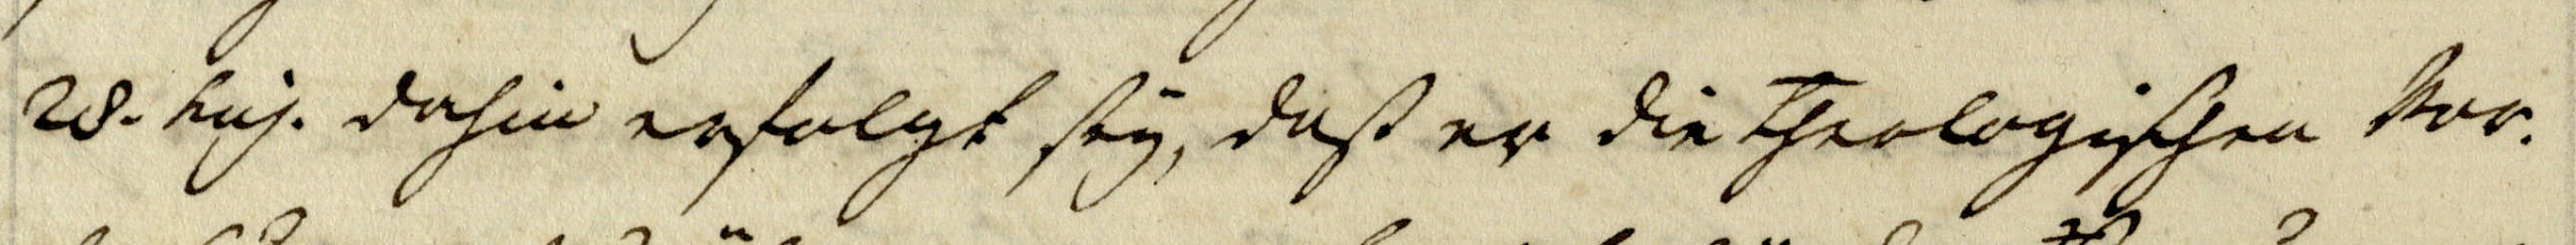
28 huj. dahin erfolgt seÿ, daß er die theologischen Vor¬
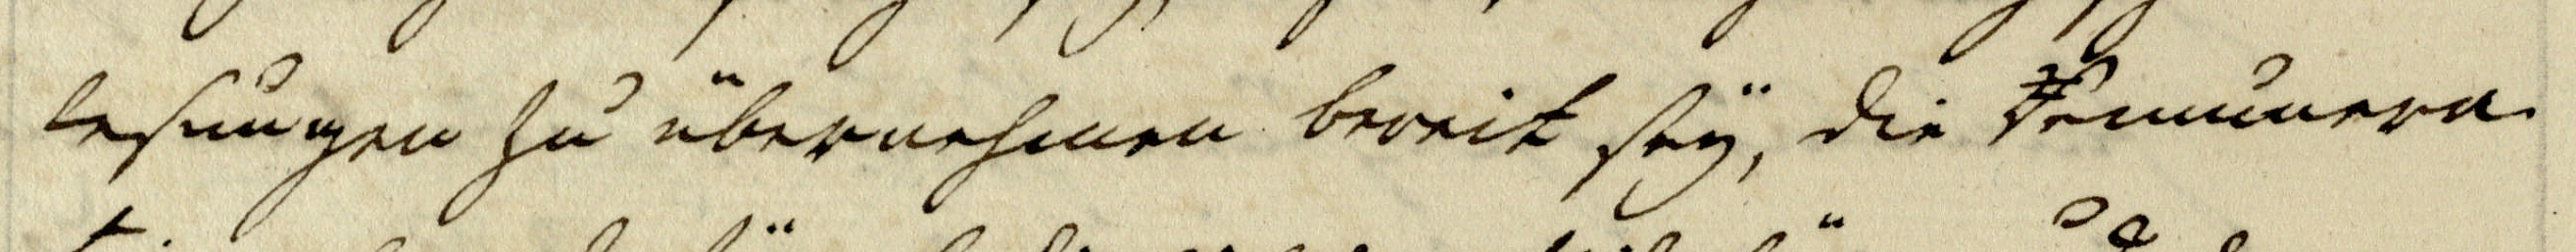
lesungen zu übernehmen bereit seÿ, die Remunera¬
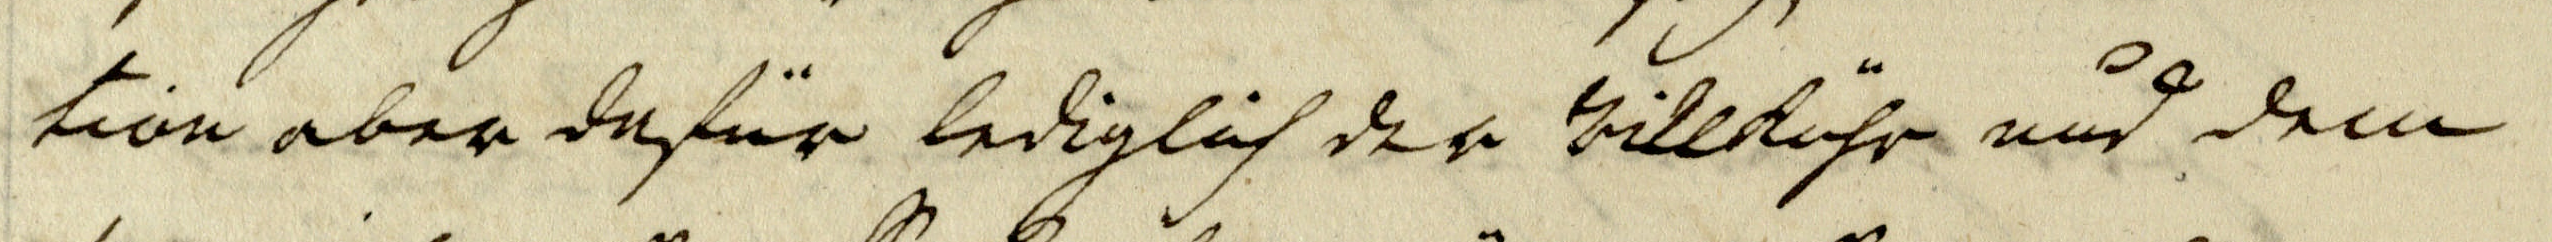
tion aber dafür lediglich der Willkühr und dem
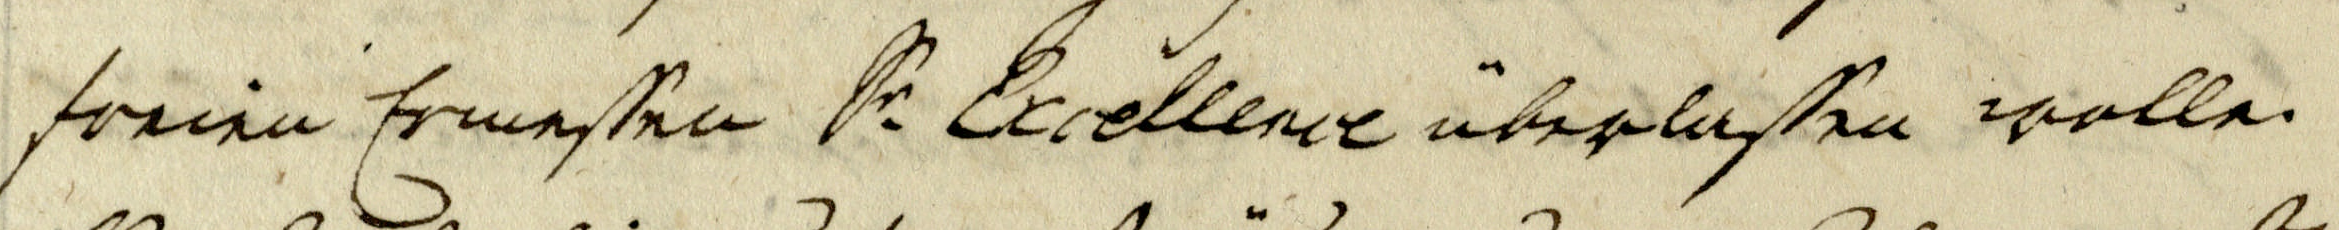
freien Ermessen Sr Excellence überlassen wolle.
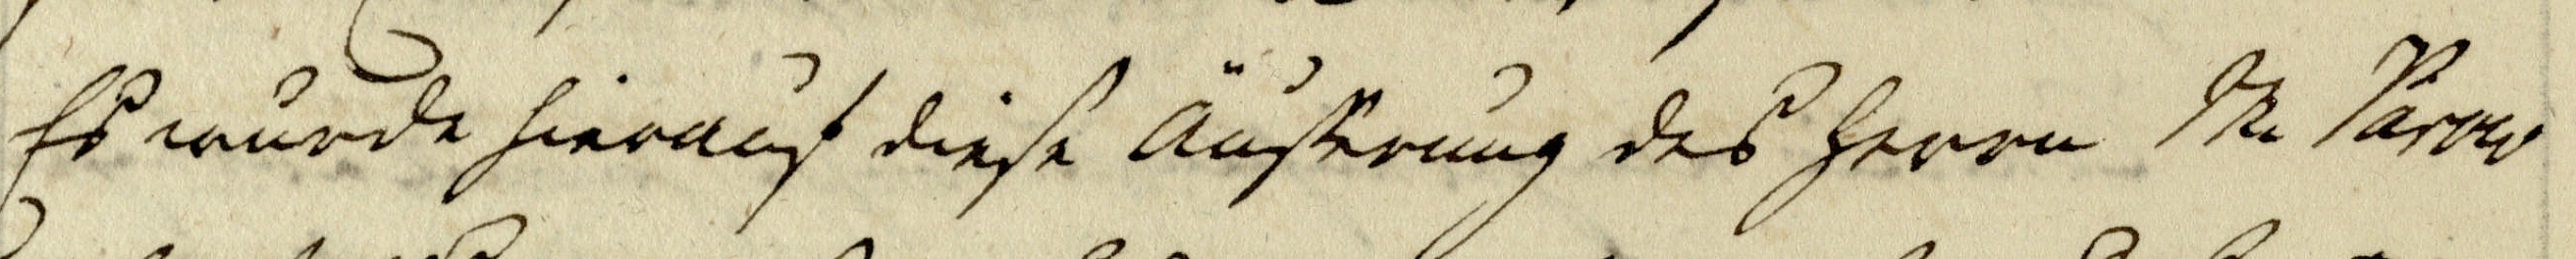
Es wurde hierauf diese Äusserung des Herrn M. Parow
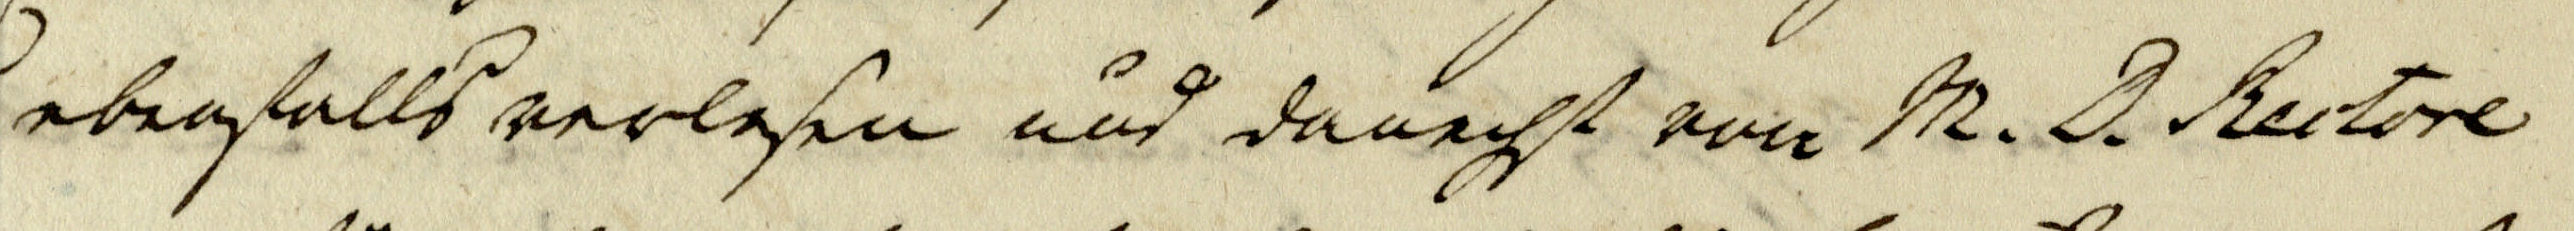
ebenfalls verlesen und danechst von M. D. Rectore
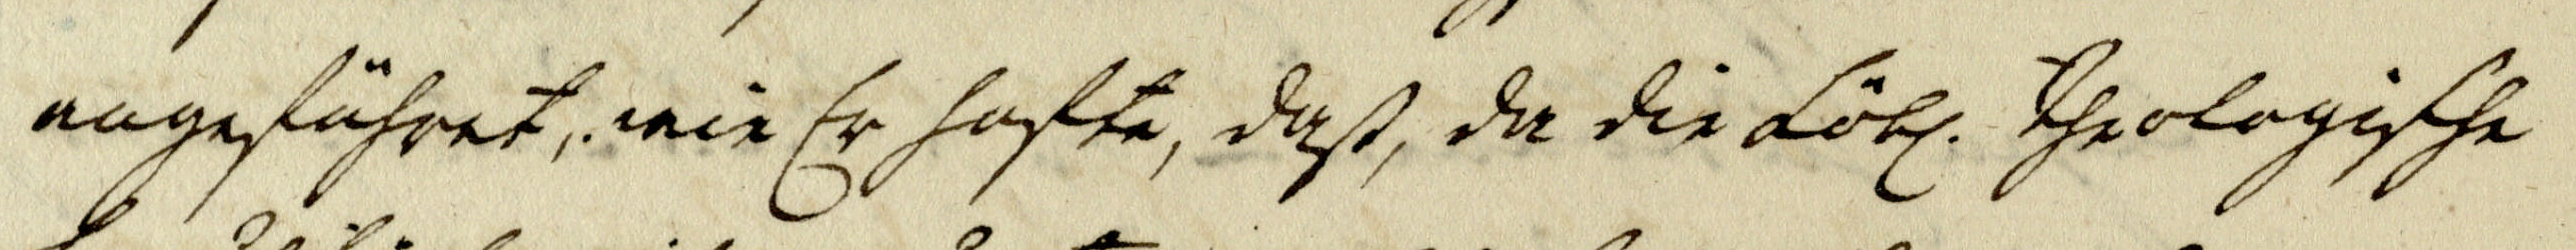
angeführet, wie Er hofte, daß, da die Löbl. Theologische
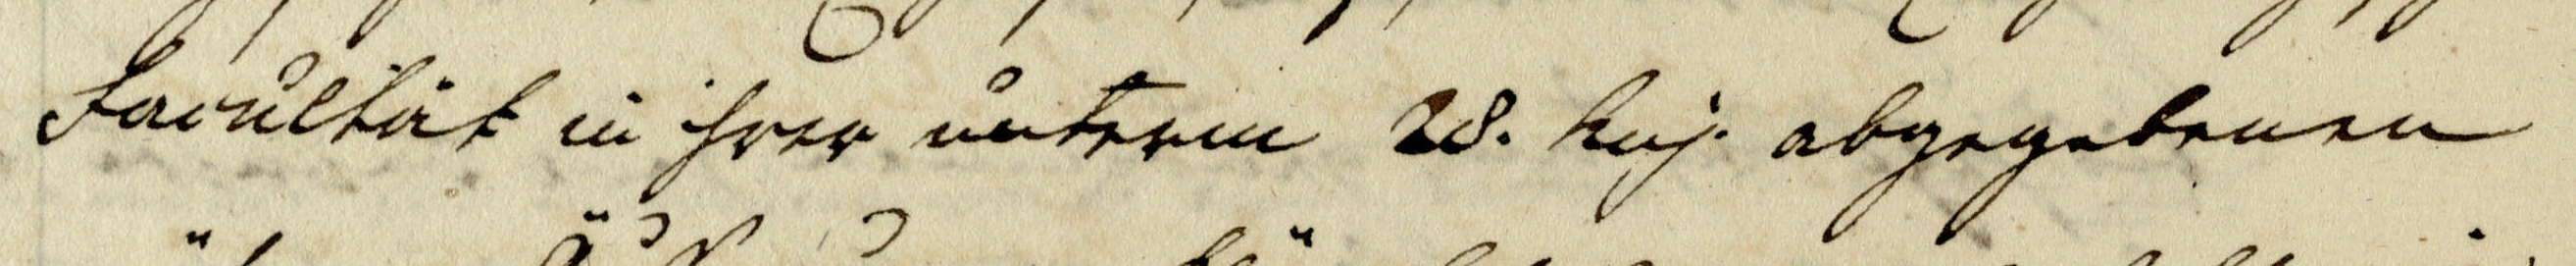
Facultät in ihrer unterm 28. huj. abgegebenen
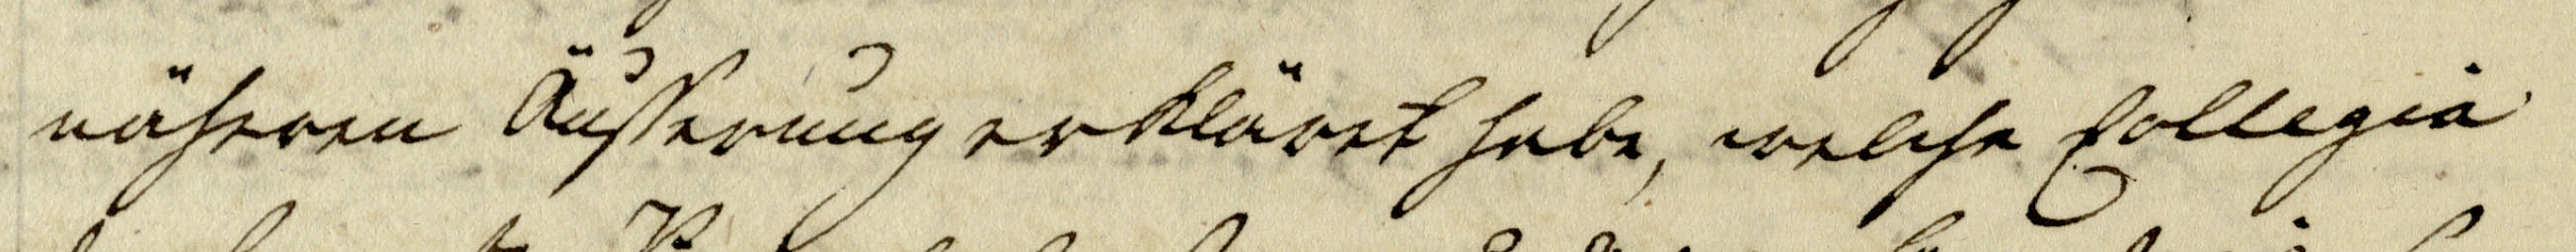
näheren Äusserung erkläret habe, welche Collegia
